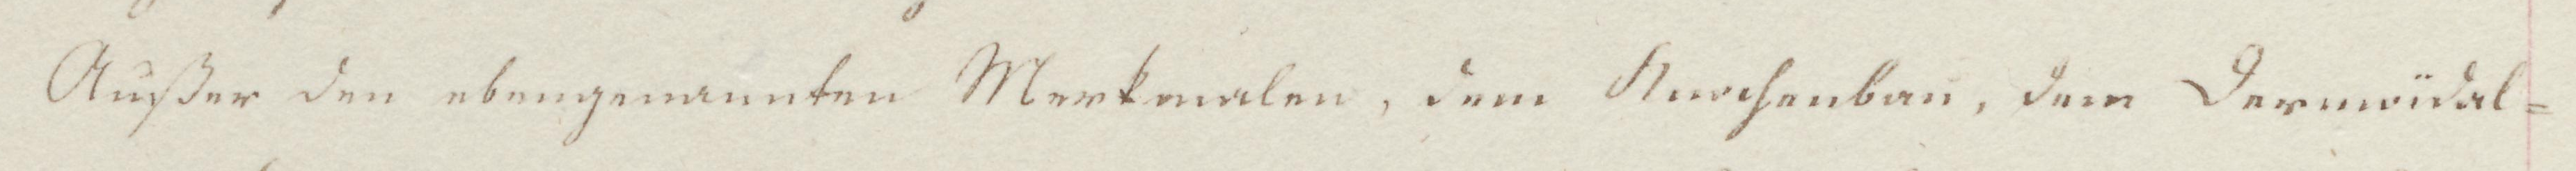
Außer den ebengenannten Merkmalen, dem Knochenbau, dem Dermoïdal-
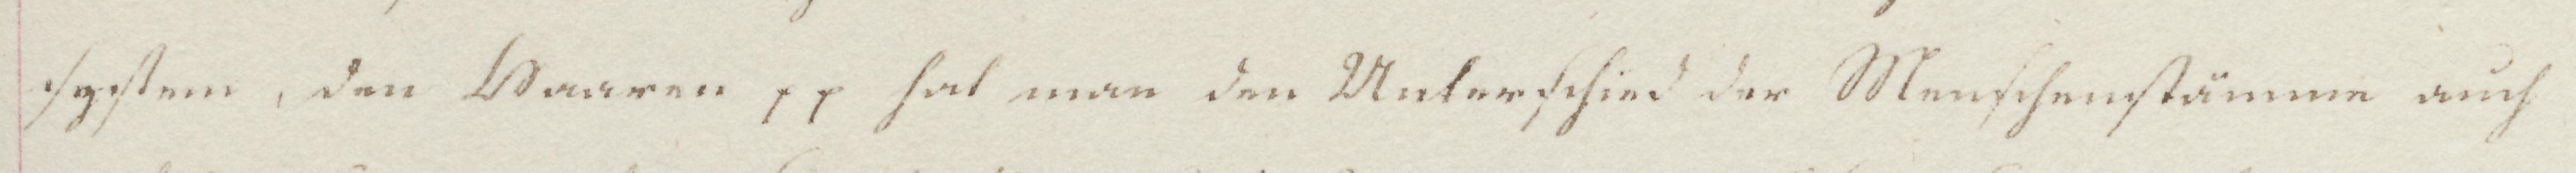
system, den Haaren p p hat man den Unterschied der Menschenstämme auch
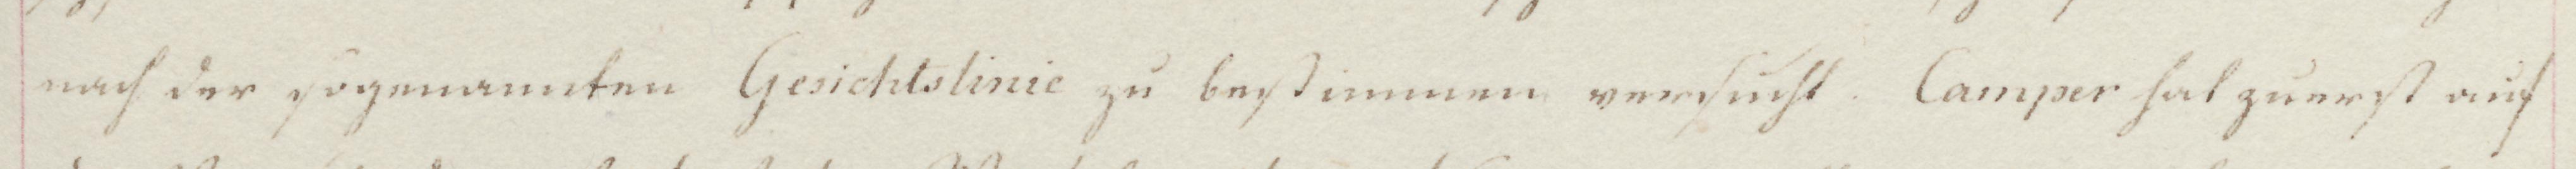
nach der sogenannten Gesichtslinie zu bestimmen versucht. Camper hat zuerst auf
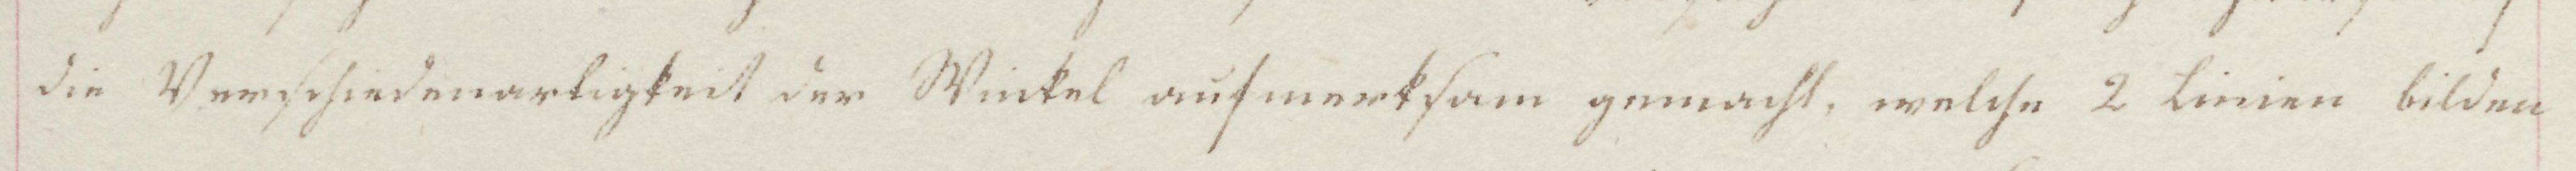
die Verschiedenartigkeit der Winkel aufmerksam gemacht, welche 2 Linien bilden
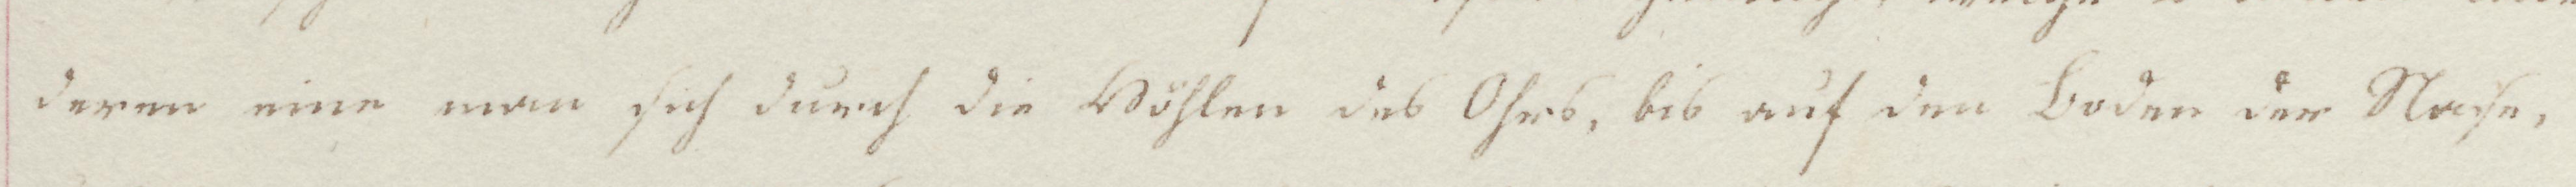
deren eine man sich durch die Höhlen des Ohrs, bis auf den Boden der Nase,
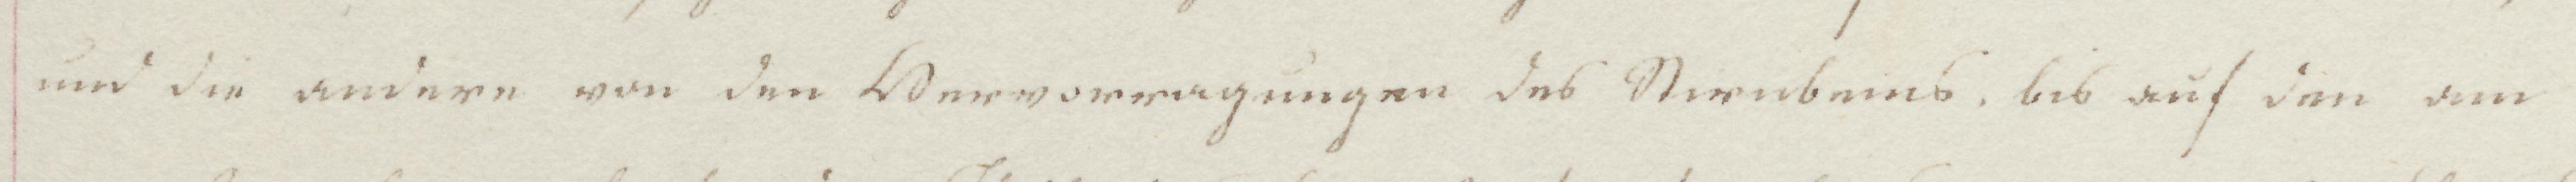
und die andere von den Hervorragungen des Stirnbeins, bis auf den am
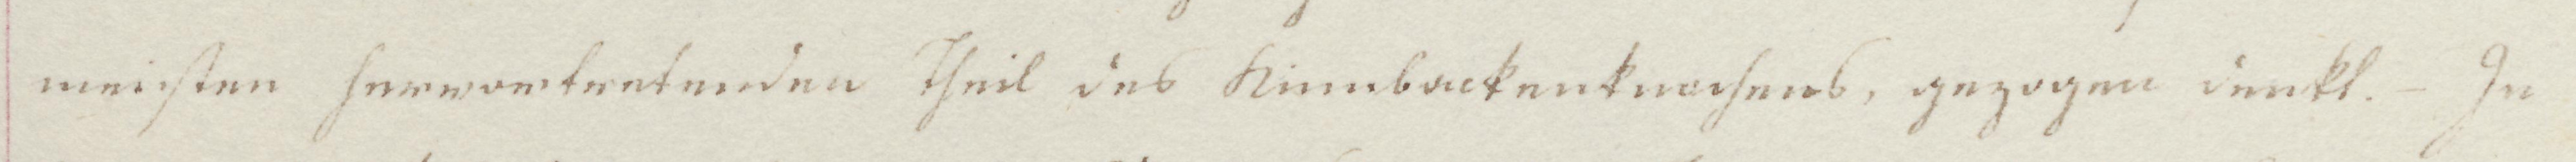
meisten hervortretenden Theil des Kinnbackenknochens, gezogen denkt. – In
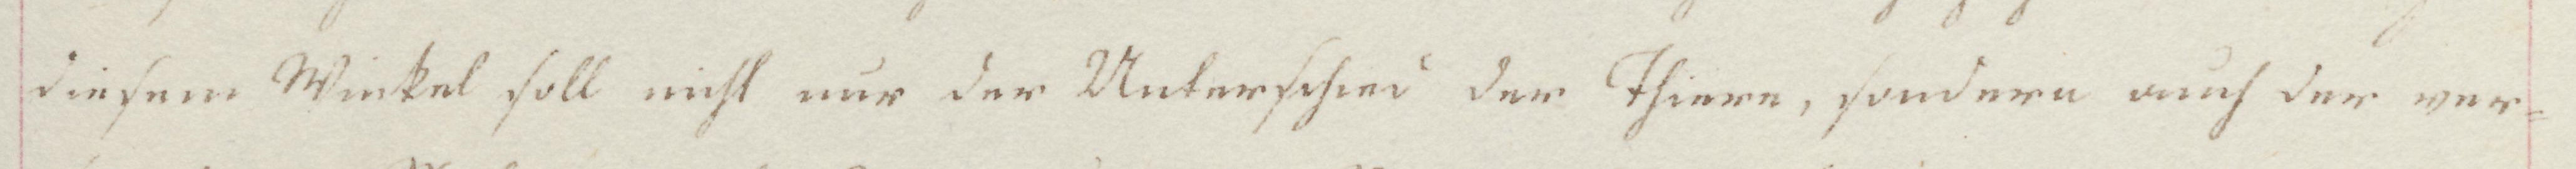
diesem Winkel soll nicht nur der Unterschied der Thiere, sondern auch der ver-
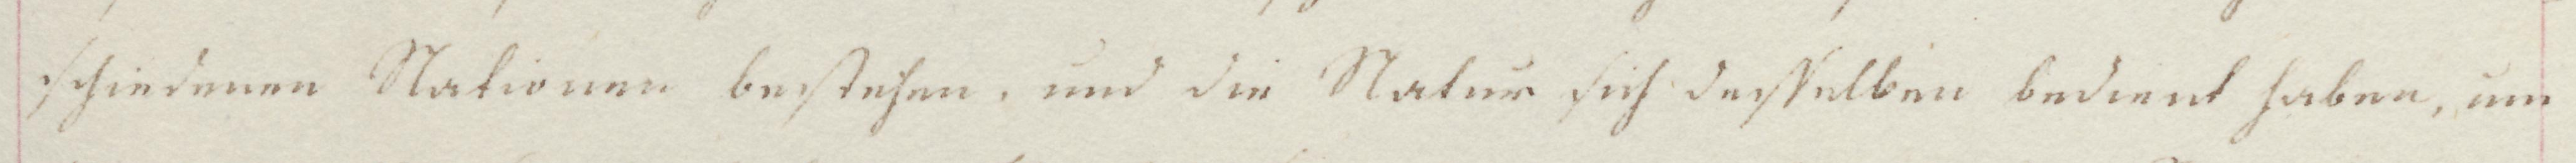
schiedenen Nationen bestehen, und die Natur sich desselben bedient haben, um
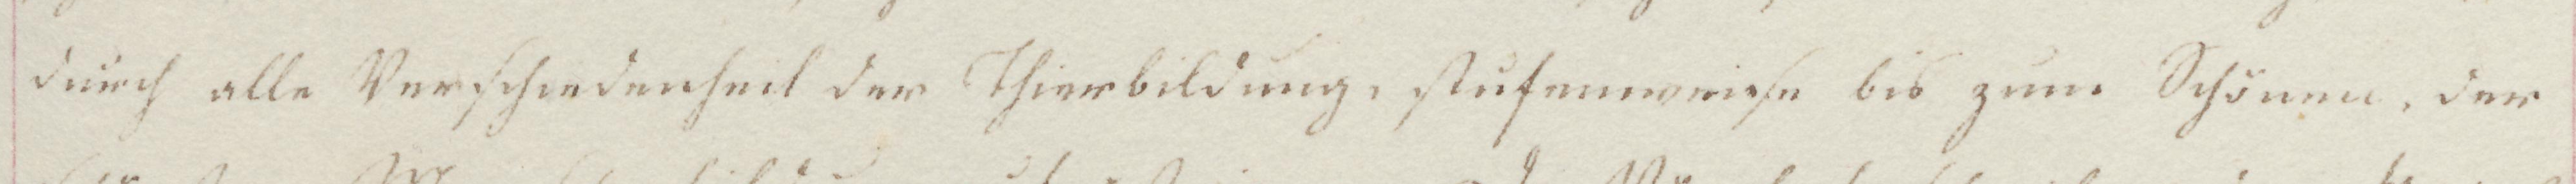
durch alle Verschiedenheit der Thierbildung, stufenweise bis zum Schönen, der
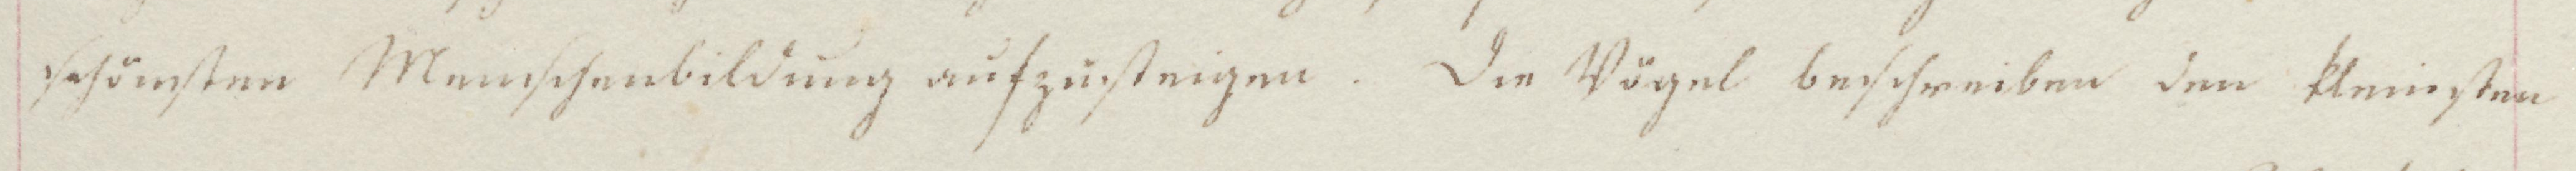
schönsten Menschenbildung aufzusteigen. Die Vögel beschreiben den kleinsten
